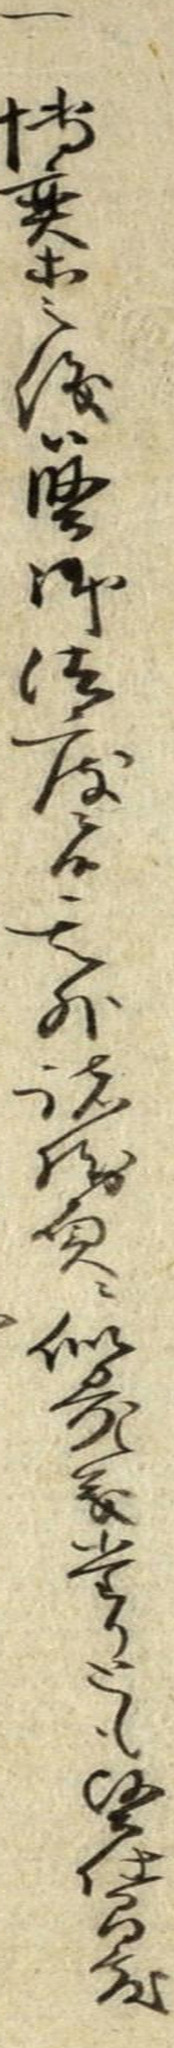一博奕等之儀ハ堅御法度ニ候其外諸勝負ニ似寄之義たりとも堅仕間敷
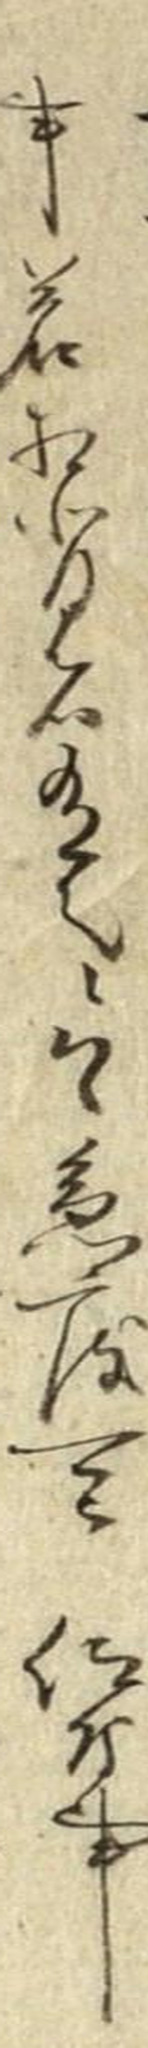事若相背者有之候ハヽ急度可被仰付事
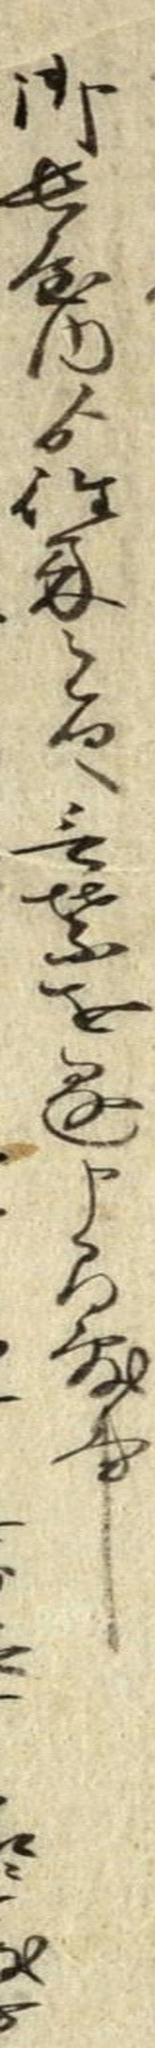一御長屋内ゟ往来之者へ言葉を懸申間敷事
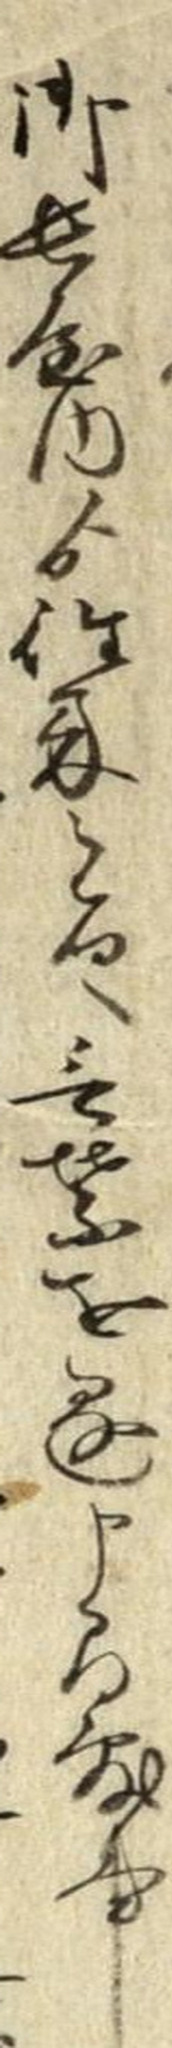一御長屋内ゟ往来之者へ言葉を懸申間敷事
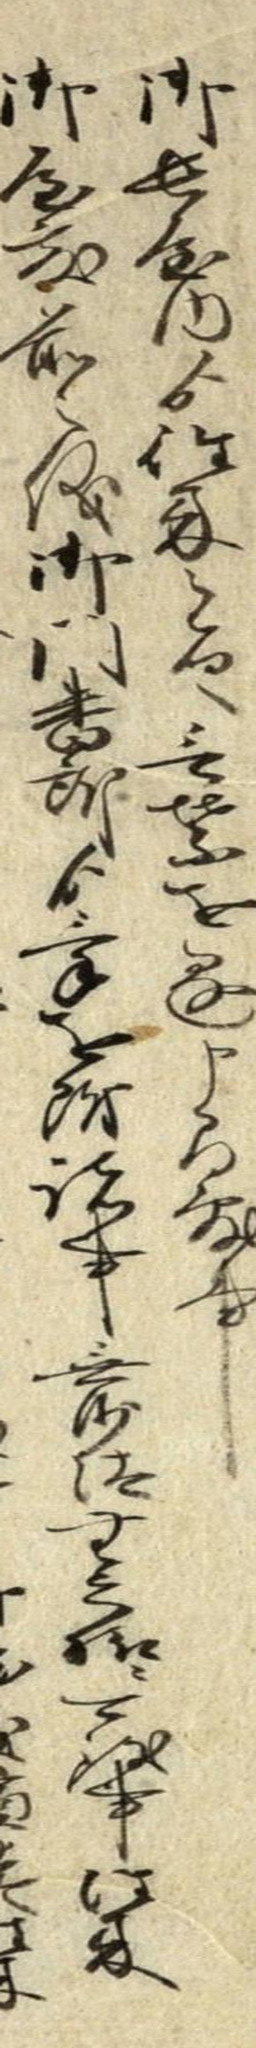一御屋敷前之儀御門番所ゟ気を附諸事無沙汰無之様ニ可致事往来
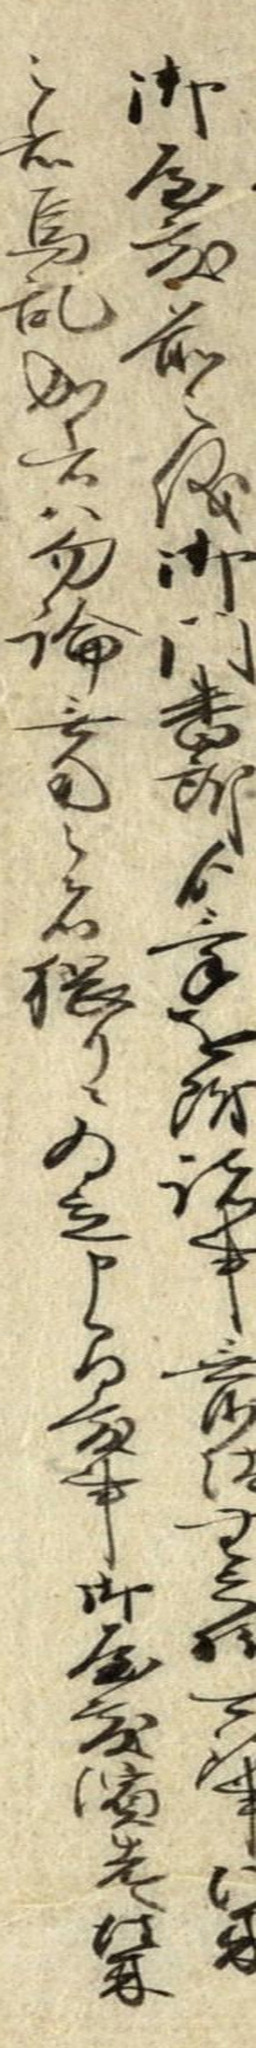之者烏乱成者ハ勿論無用之者猥りニ為立申間敷事御屋敷浜先へ往来
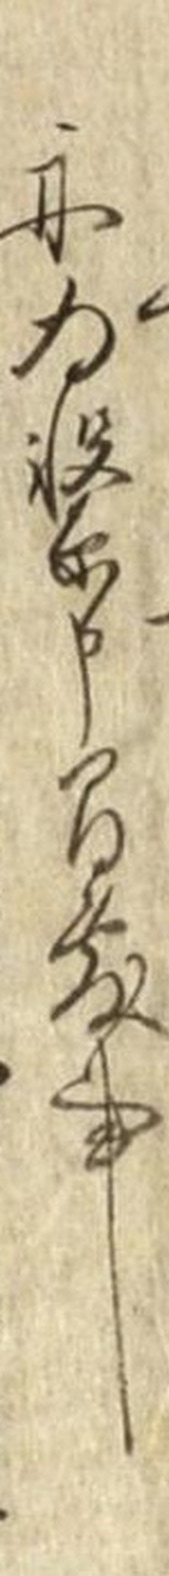舟為繋申間敷事
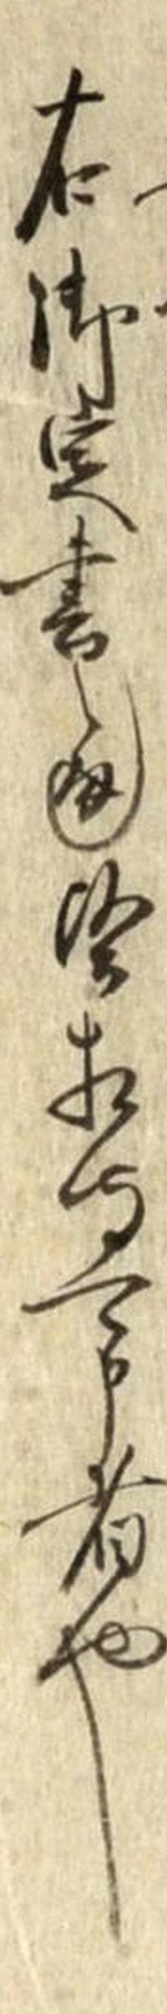右御定書之通堅相守可申者也
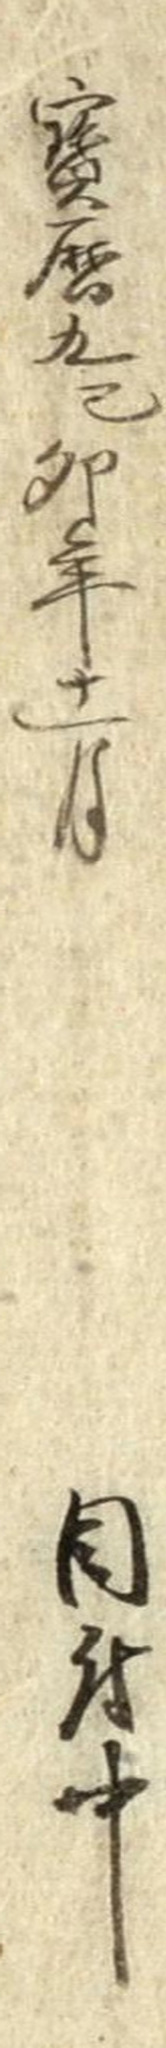宝暦九己卯年十一月目付中
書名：三都并道中之部
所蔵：福井県文書館 Fukui Prefectural Archives
